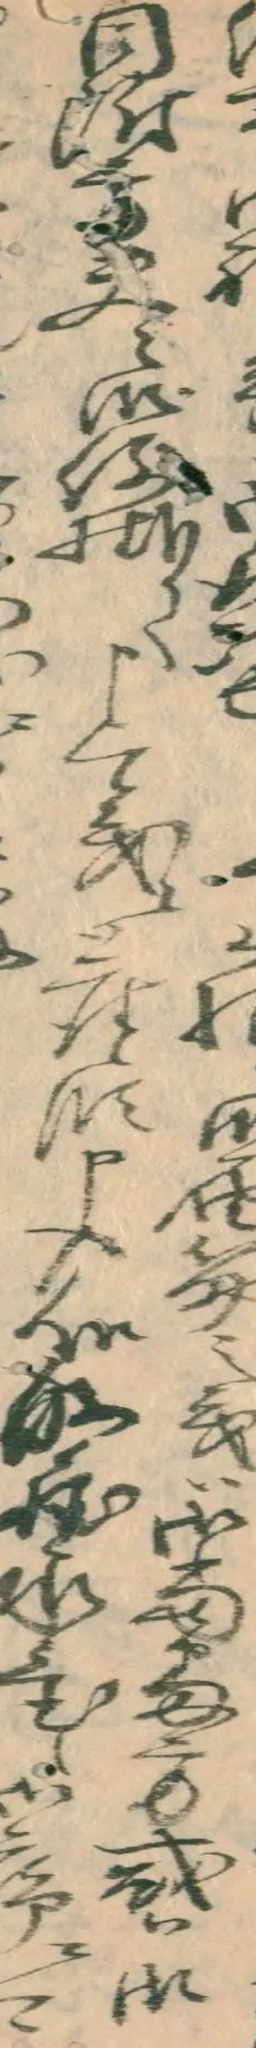目付方夫々御役掛りへ申上候義ニ御座候段申入候処成程承置候御序ニ可
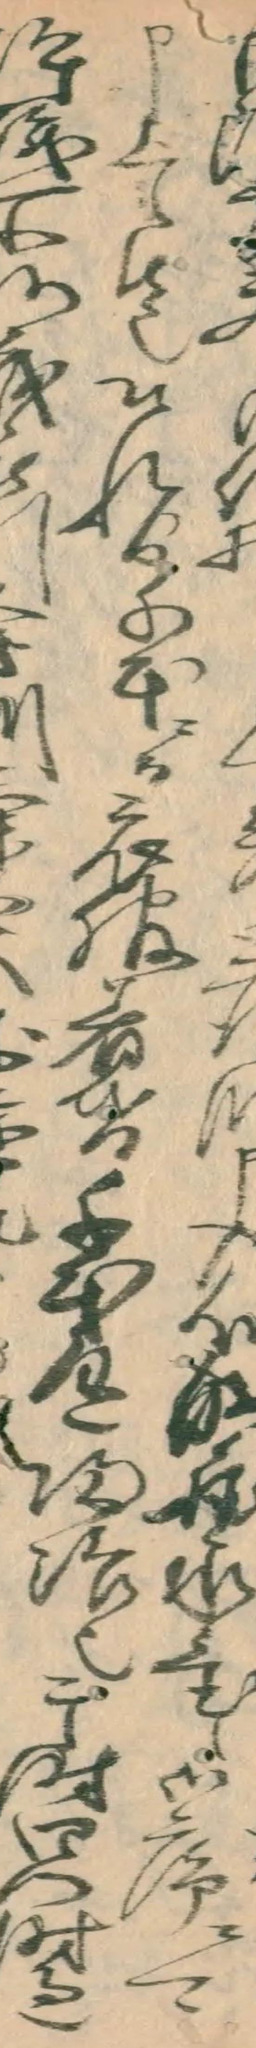申上候由也それゟ千本ニ而衣服着替千本通帰治也于時四ツ時過
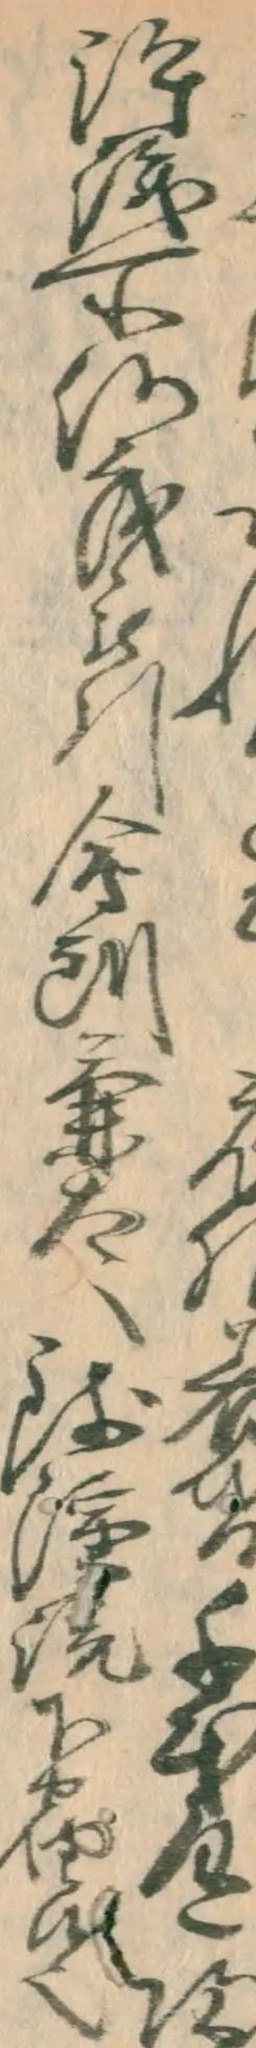評議所何も被引会所兼太へ致演説下宿候也
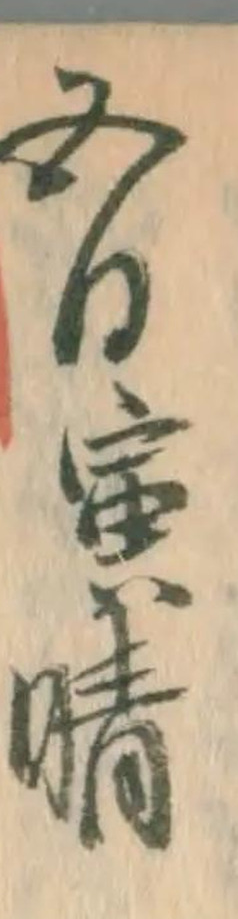五日寅晴
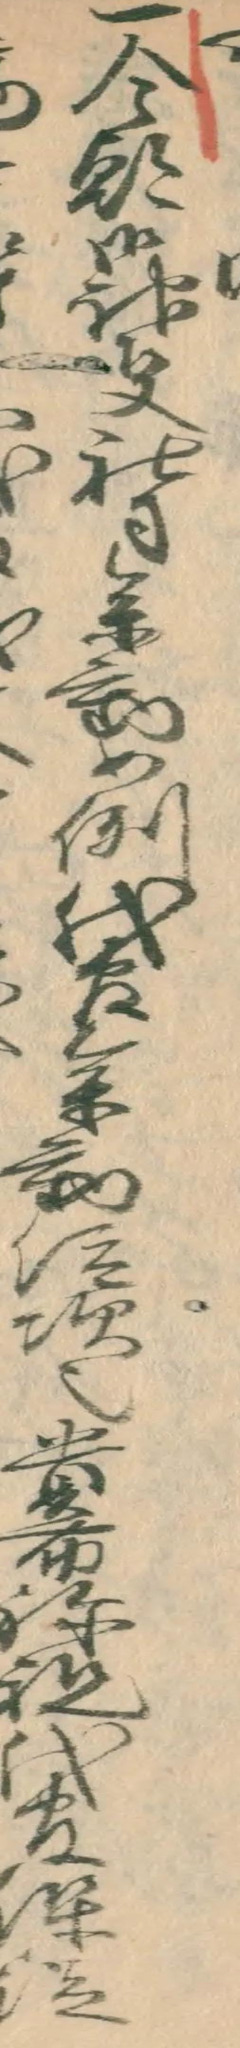一今朝御神事社司参勤如例代官参勤位次也貴布弥祝代官保従
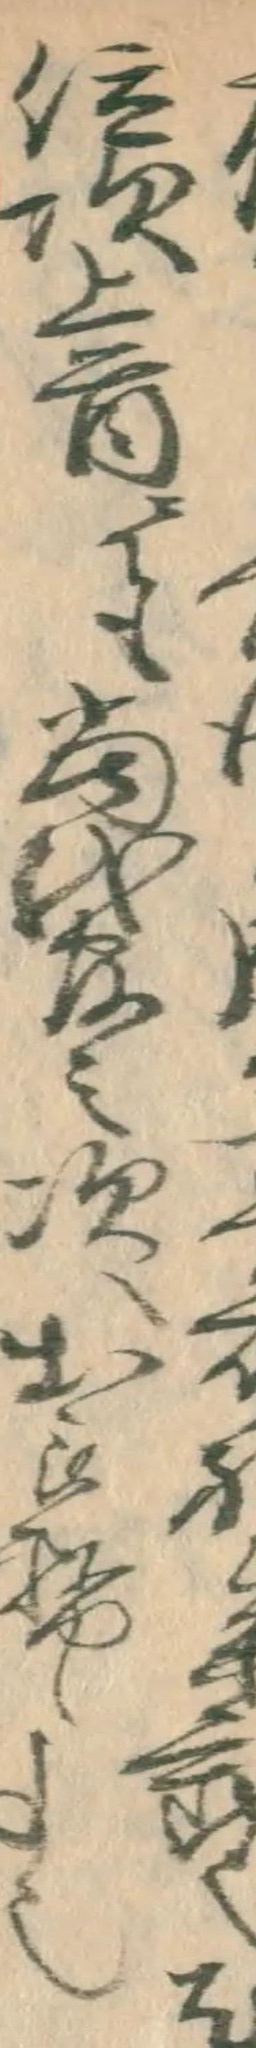位次上首ニても当代官之次へ出被務候事也
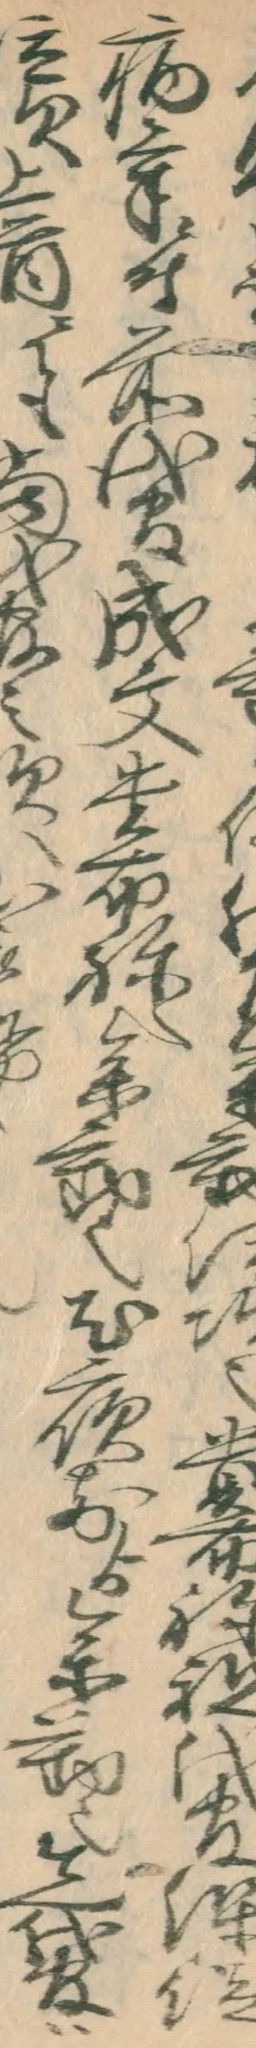病気ニ付前代官成文貴布称へ参勤也尤夜前ゟ参勤也先代官ハ
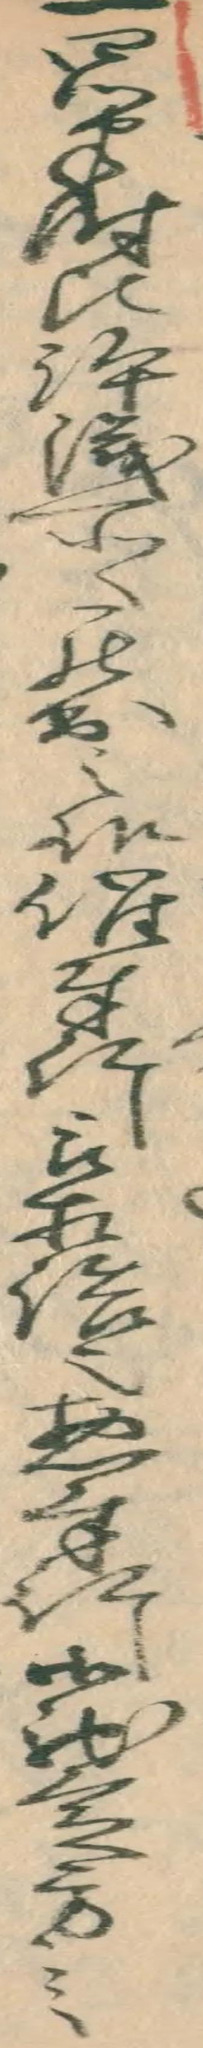一四ツ半時比評議所へ罷出之処催奉行被相詰也惣奉行御馳走方之
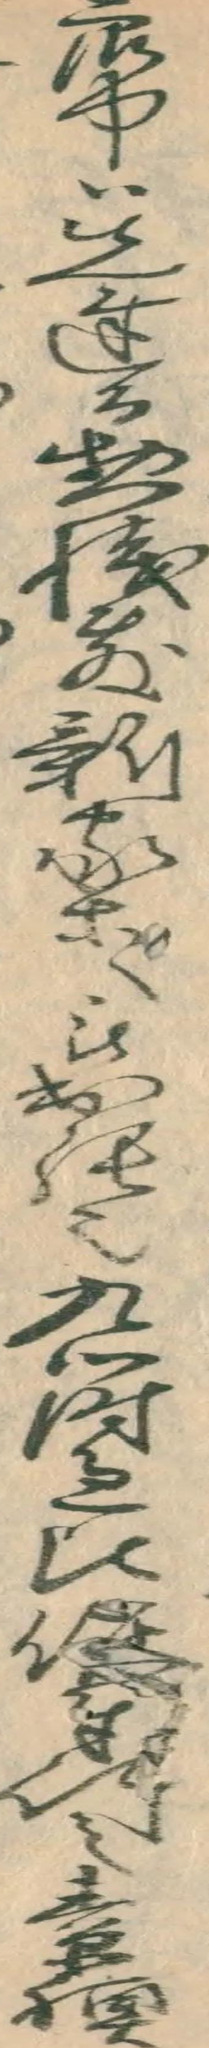衆中ハ先達而惣桟敷新家等へ被出張也九ッ時過比催奉行之素襖
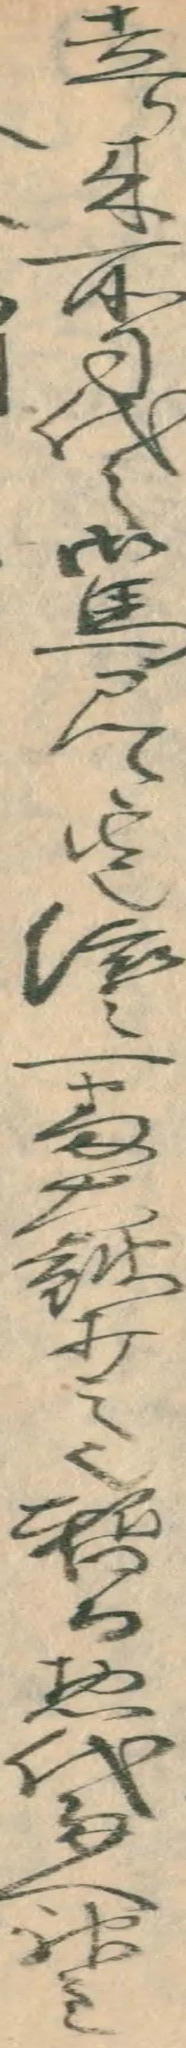走り来所司代之御馬見へ候由也依之一番大鼓打之也暫而惣代両人神主
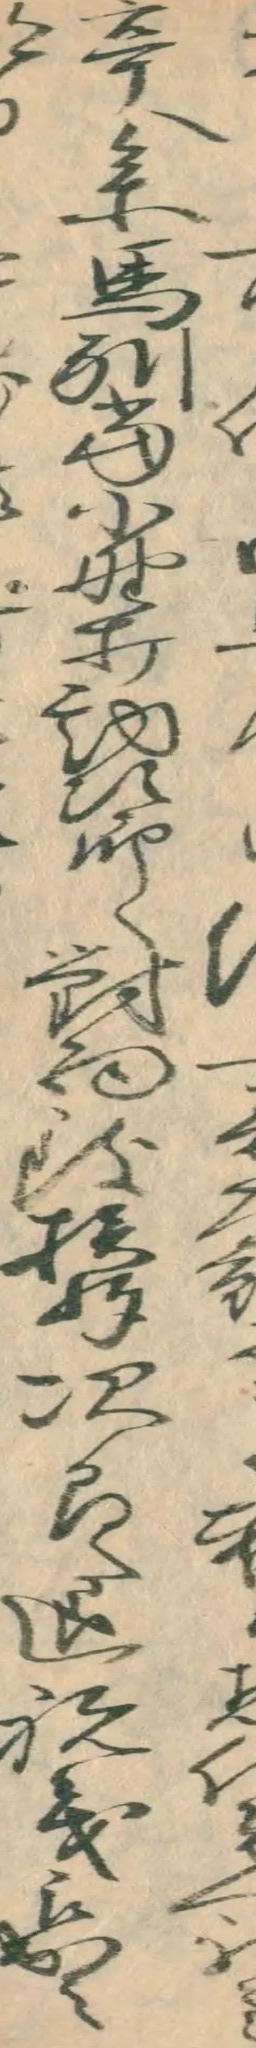亭へ参馬別当小野打勘次郎へ対面致挨拶次ノ間へ退祝義被出之
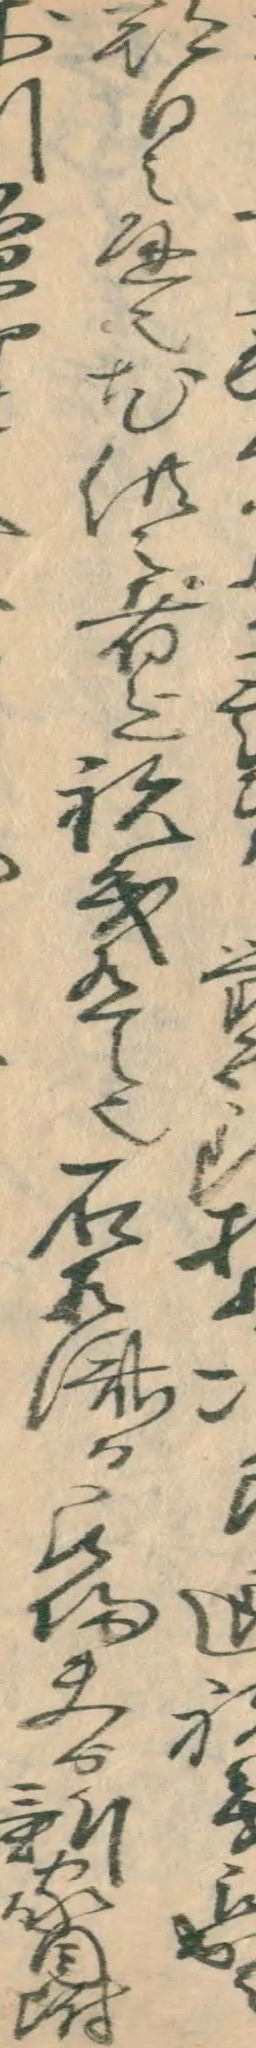朔日之通也尤供之者迄祝義有之也右相済而罷帰夫ゟ新家目付
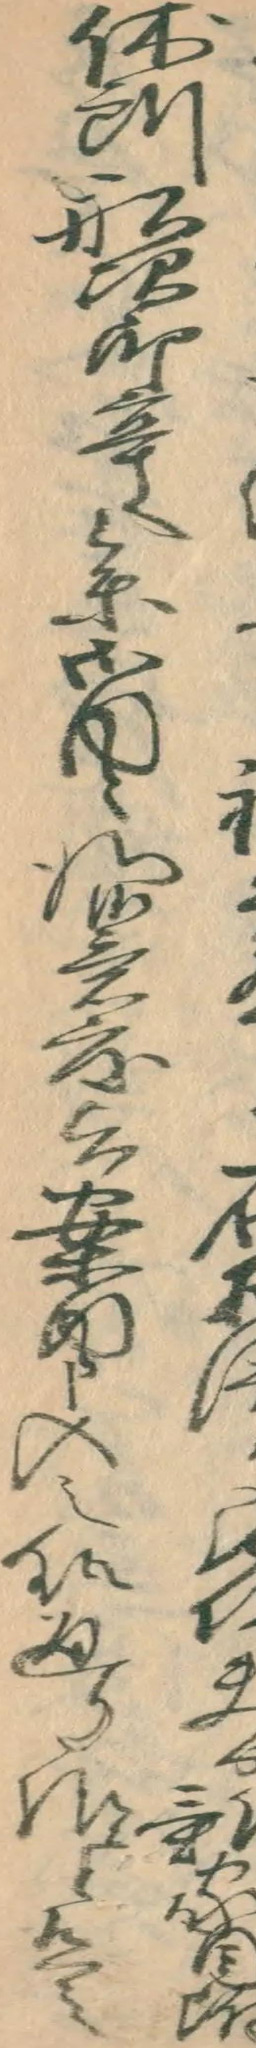休所船次郎亭へ参御内々得御意度旨案内申入之処り候様ニと有之

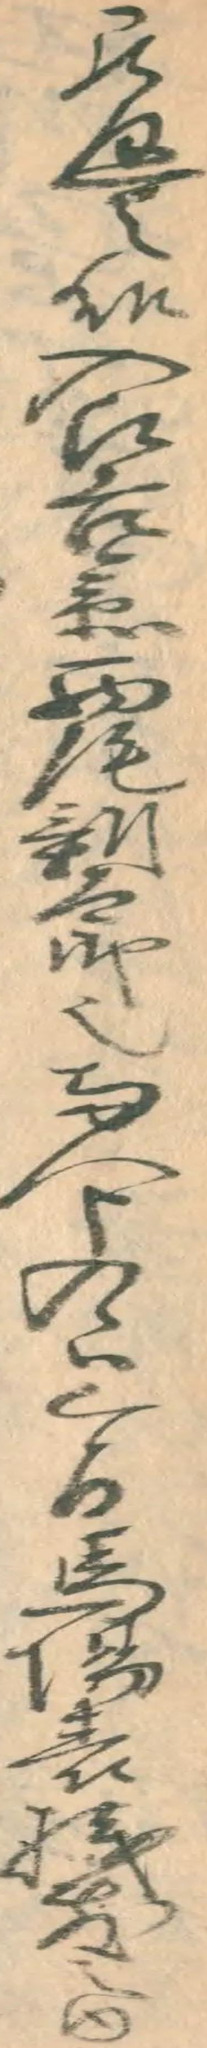罷通之処入江谷兵衛西尾新太郎也両人申入候ハ今日馬場表桟敷之内
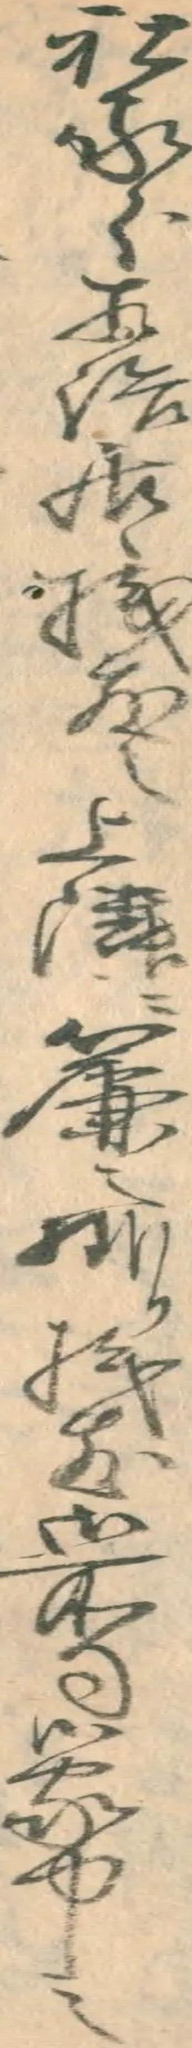社家分相詰居候桟敷之上隣ニ簾之掛り桟敷御所司御家中之
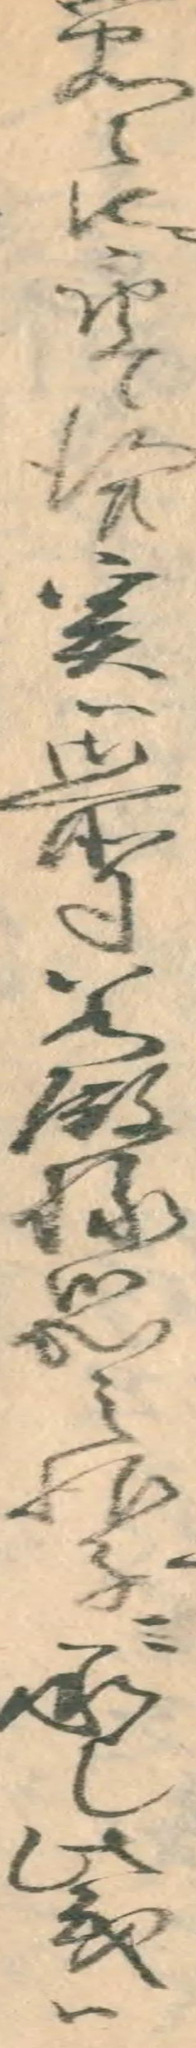御客之由ニ御座候得共実ハ御所司若殿様御出之様子ニ承申候此義ハ
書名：賀茂社記録. 第58冊
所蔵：国立国会図書館 National Diet Library, JAPAN
